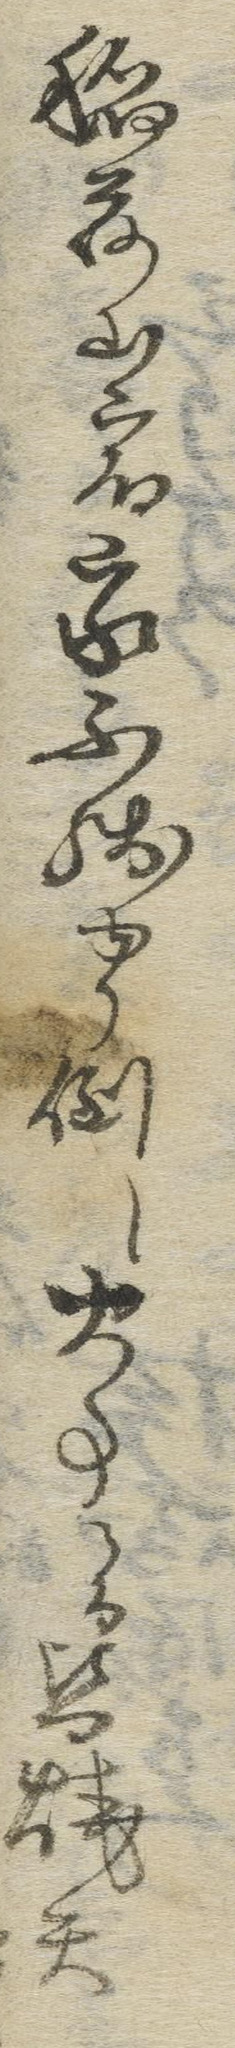稲荷山宿家不残ゆり倒し火事二而皆焼失せり
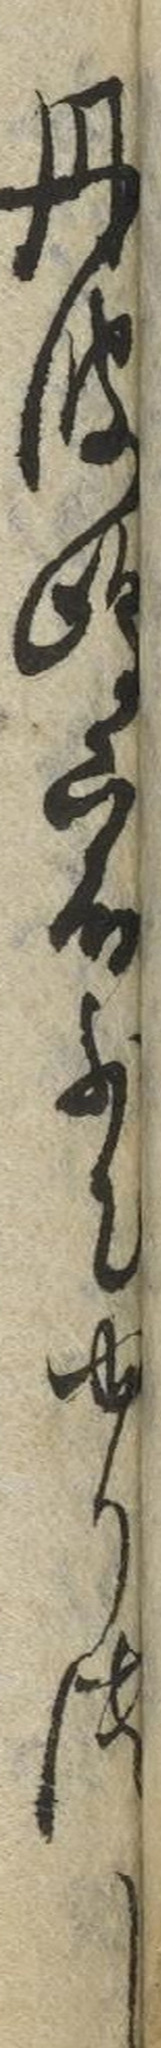丹波嶋宿少しゆり潰し
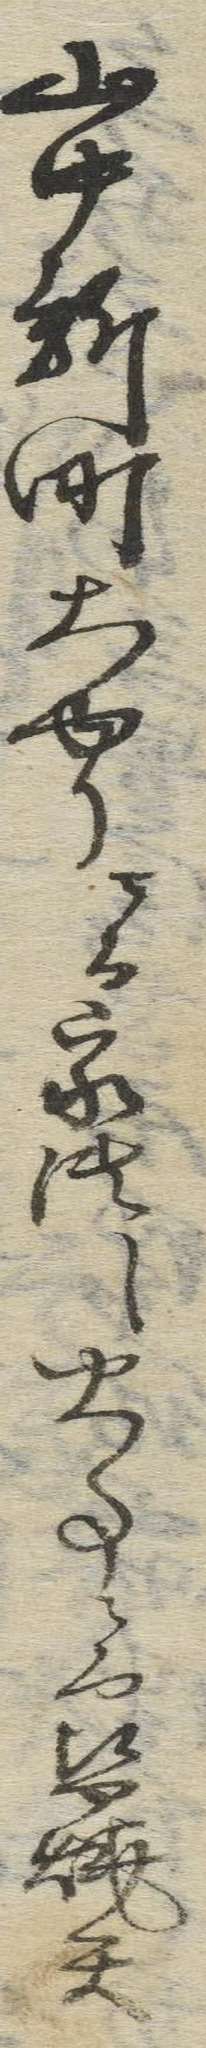山中新町大ゆり二而家潰し火事二而皆焼失
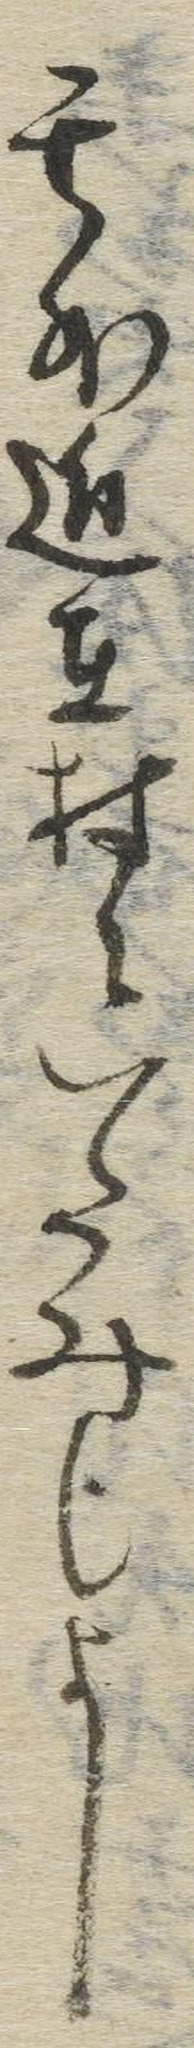其外近在村々いたみ申候よし
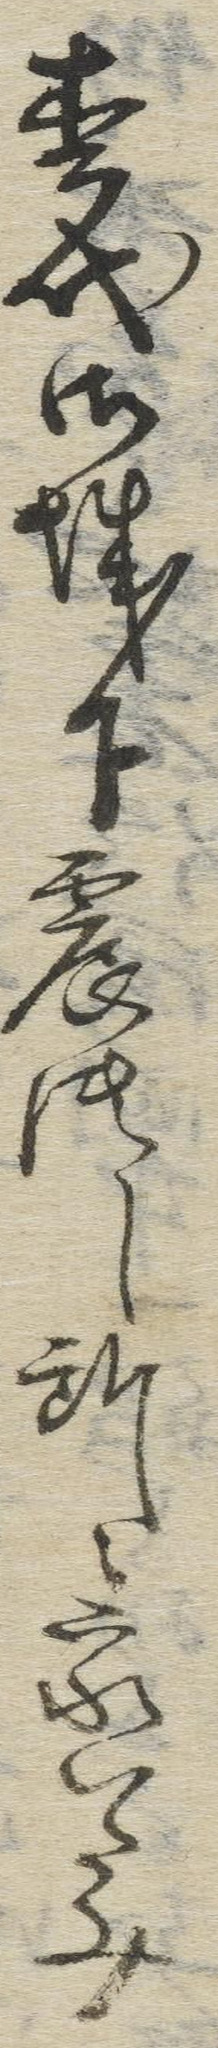松代御城下震潰し所々家いたみ
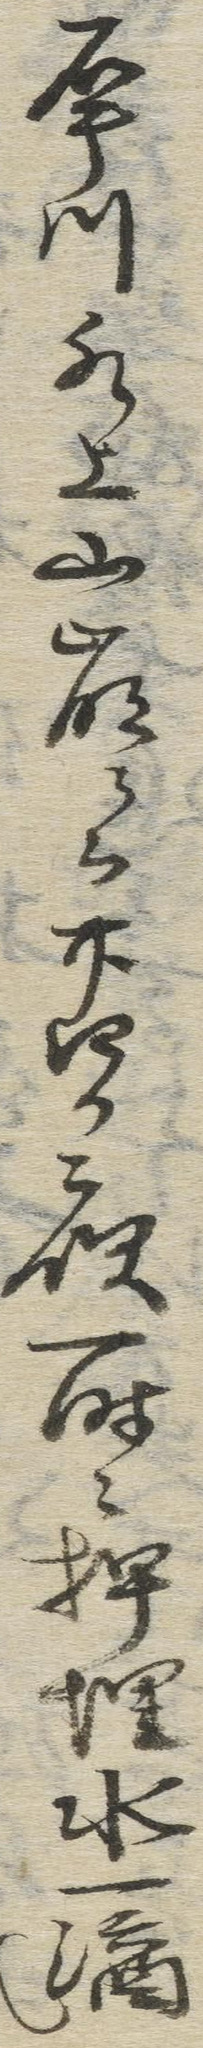犀川水上山崩二而廿四日夜一時二押埋水一滴も
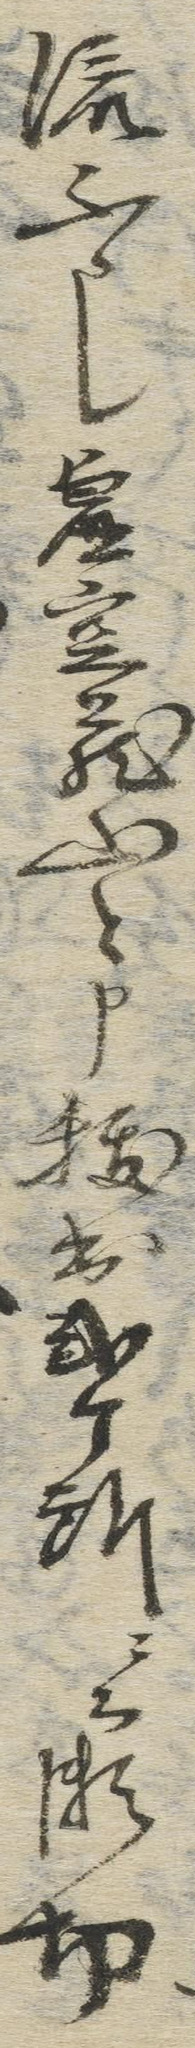流不申候虚空蔵山と申抜出弐ヶ所二而瀬切
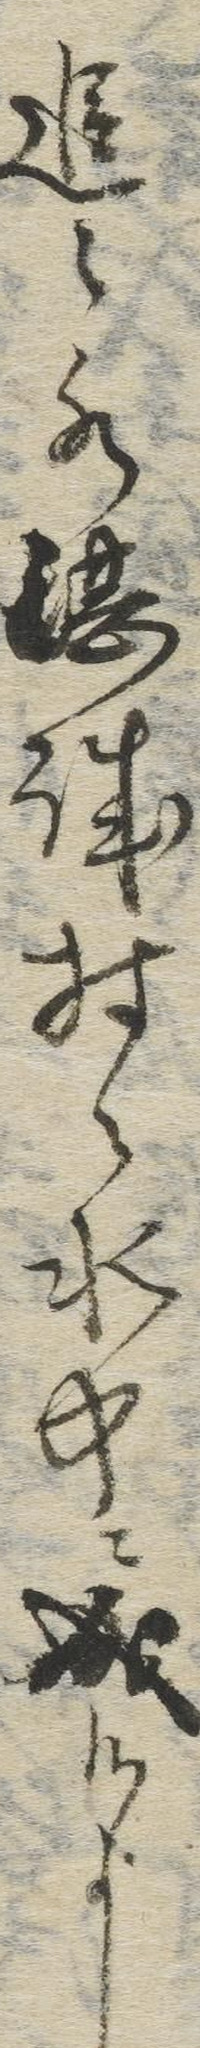追々水湛誠村々水中二成候よし
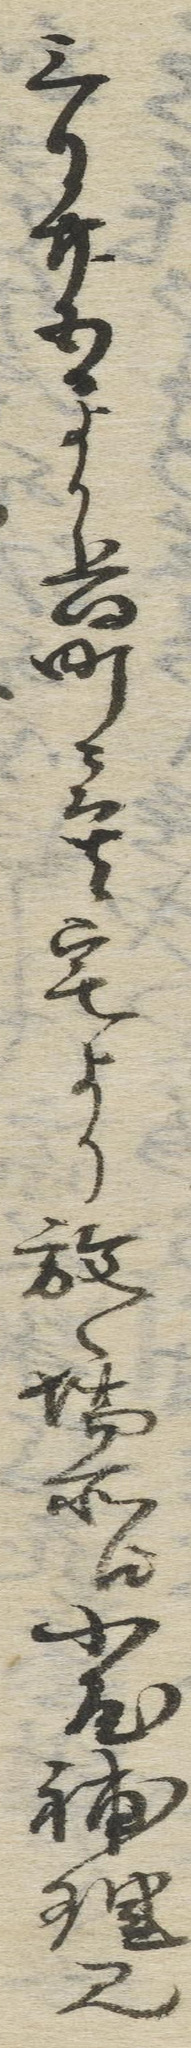三月廿五日より上田町二而は宅より放候場所江小屋補理見
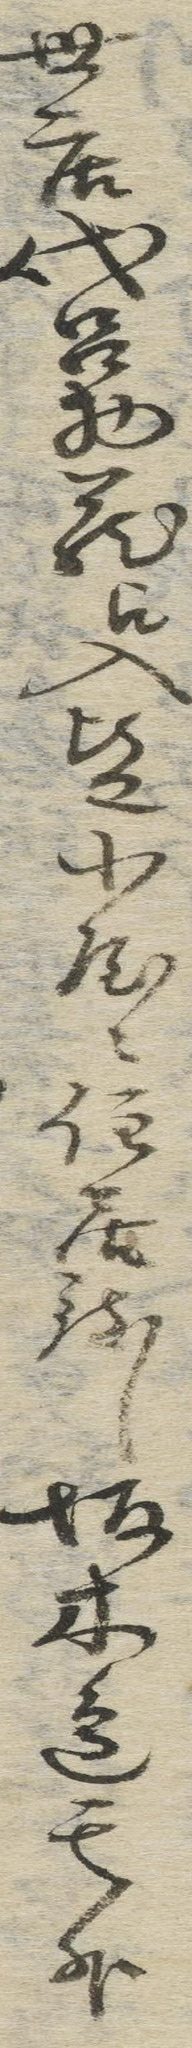世店代呂物蔵江入皆小屋二住居致し坂木辺其外
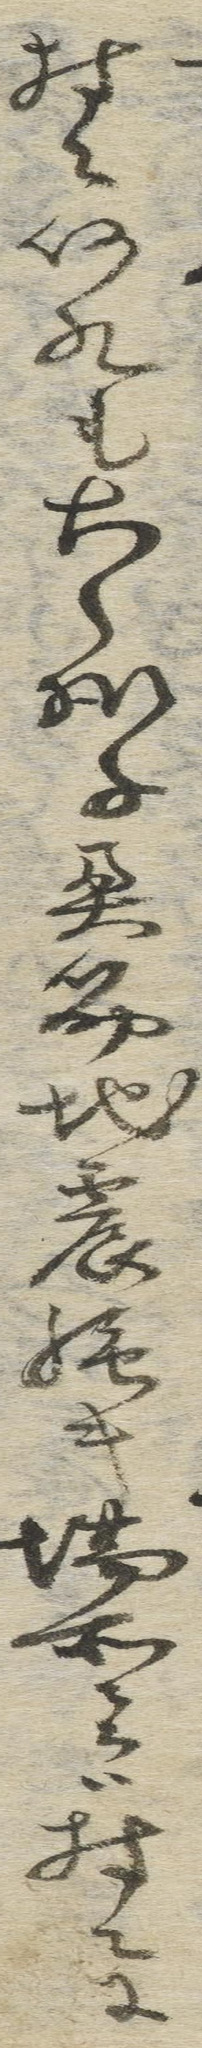村々何れも右之様子奥筋地震強キ場所二而ハ村々に
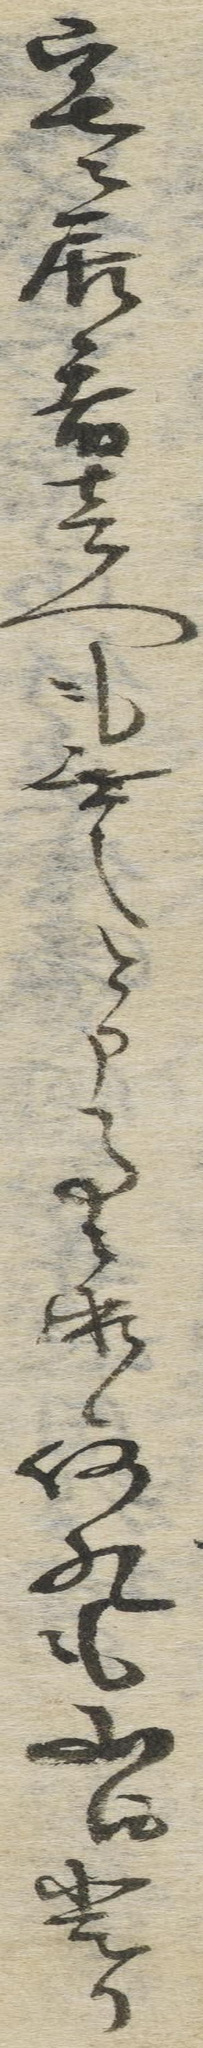宅二居候者壱人も無之と申事承候何れも山江登り
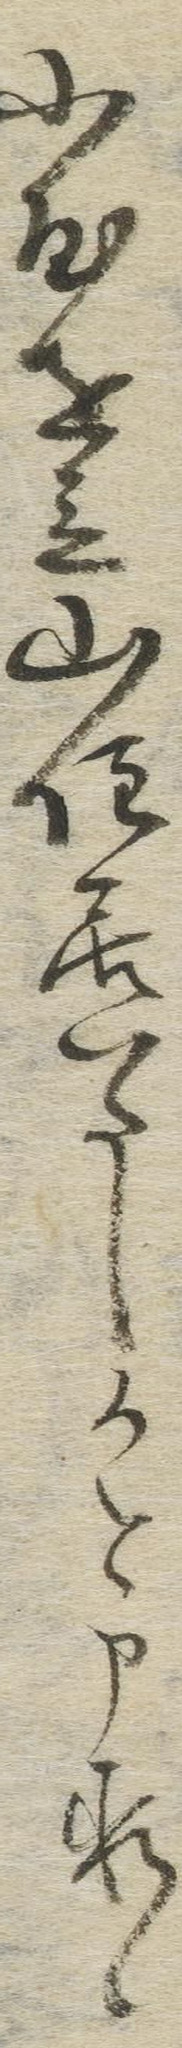小屋を立山住居いたし候と申承候
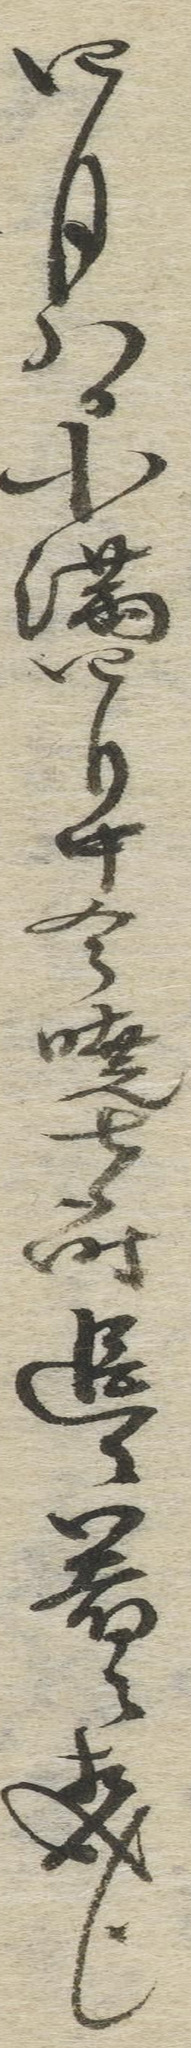四月八日小満四月中今暁七ッ時追々暑々相成申候
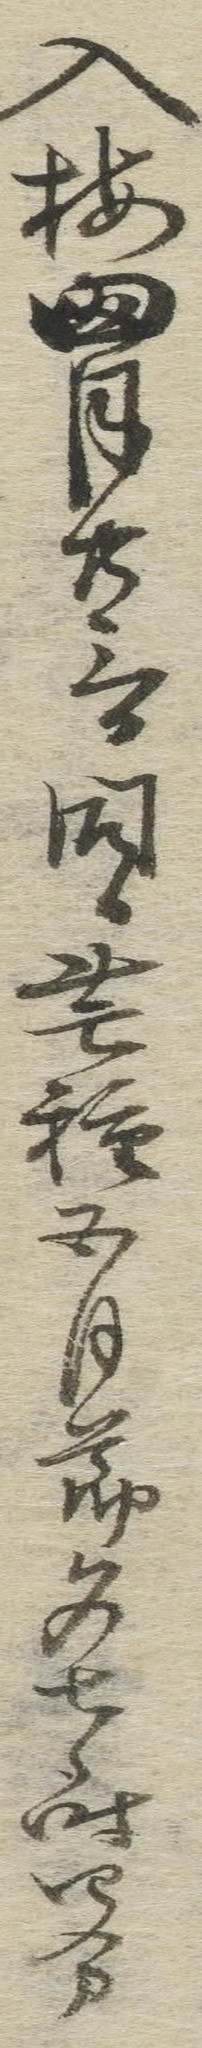入梅四月廿三日同日芒種五月節夕七ッ時四分
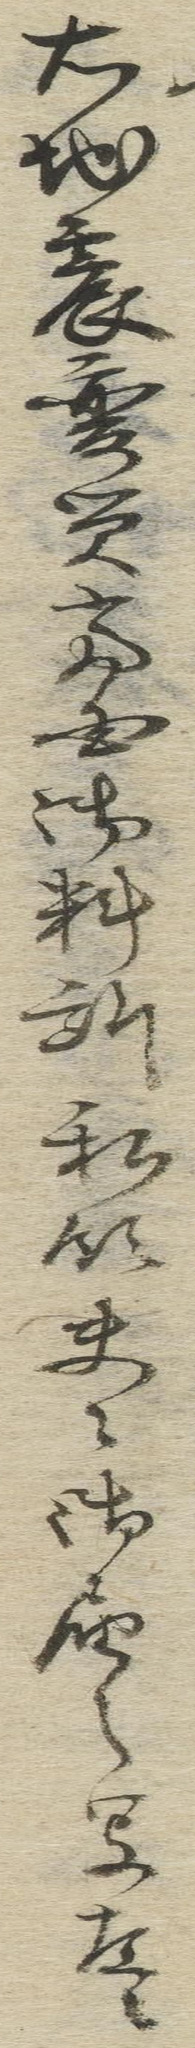大地震変災当国御料所私領夫々御届之写左之二
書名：信濃越後　地震書留
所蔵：東京大学地震研究所図書室 Earthquake Research Institute Library, The University of Tokyo, JAPAN
